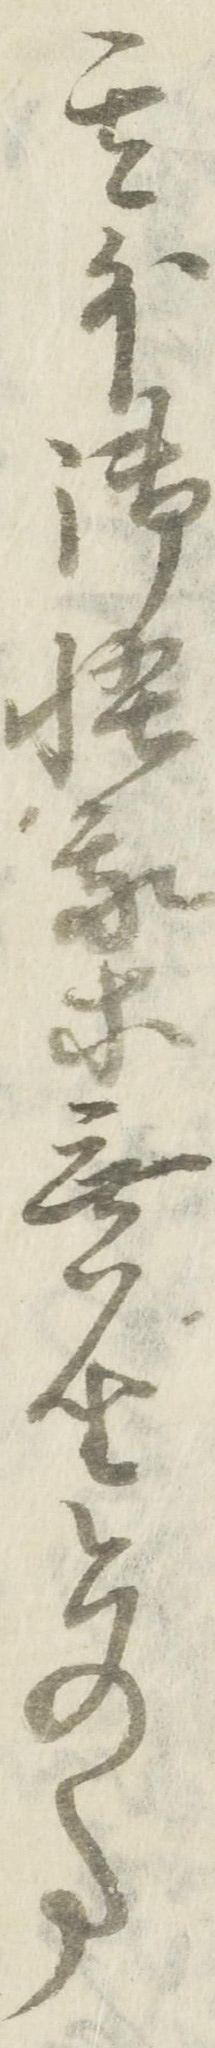其外御怪我等無御坐との事
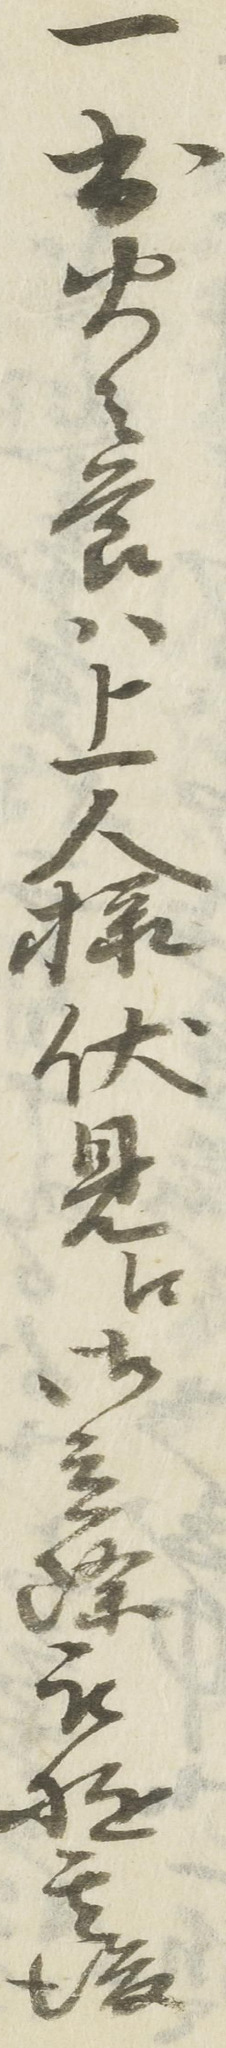一出火之節は上人様伏見え御立除被遊其後
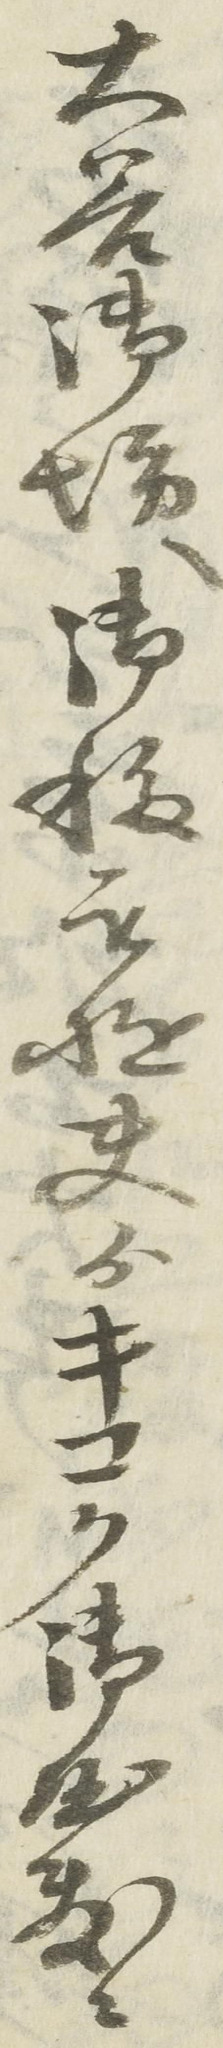大谷御坊へ御移被遊夫ゟキコク御屋敷ニ
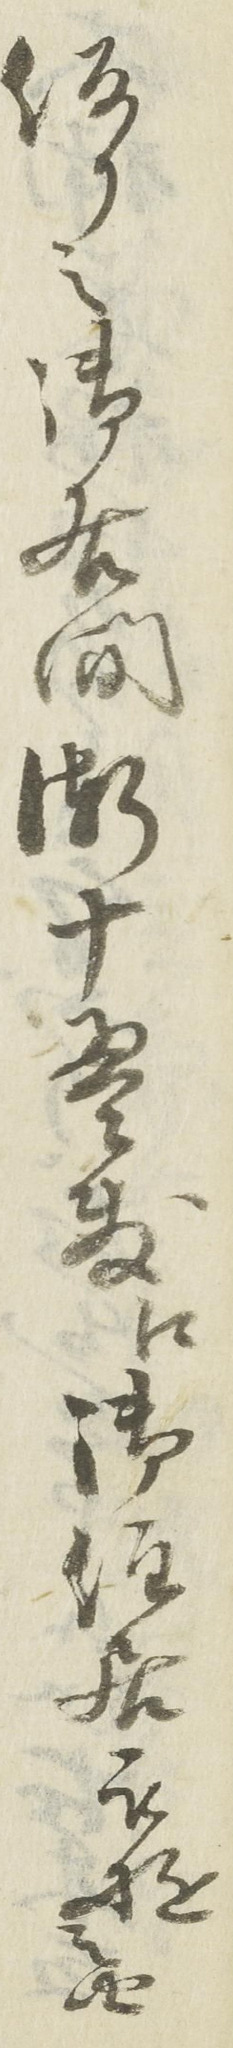仮り之御居間漸十畳敷え御住居被遊之由
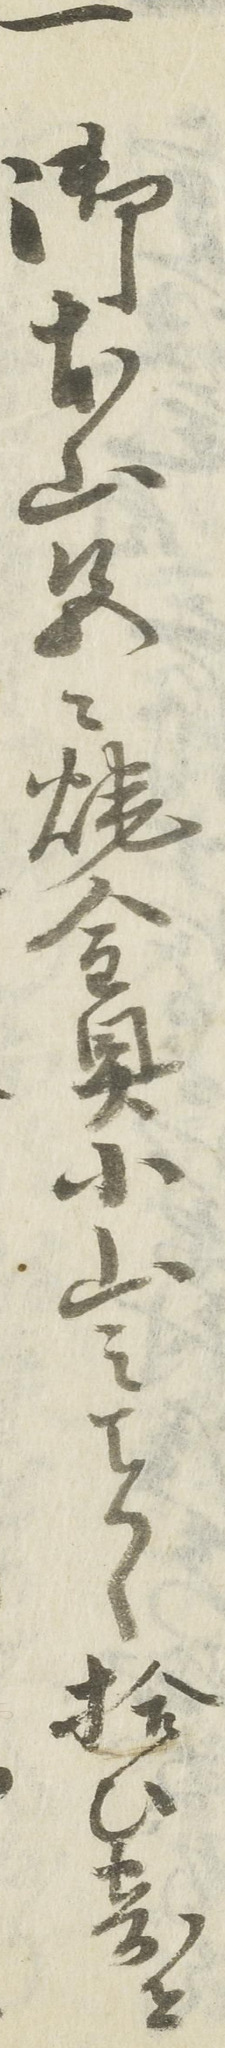一御本山色〻焼金具小山之ことく拾ひ寄せ
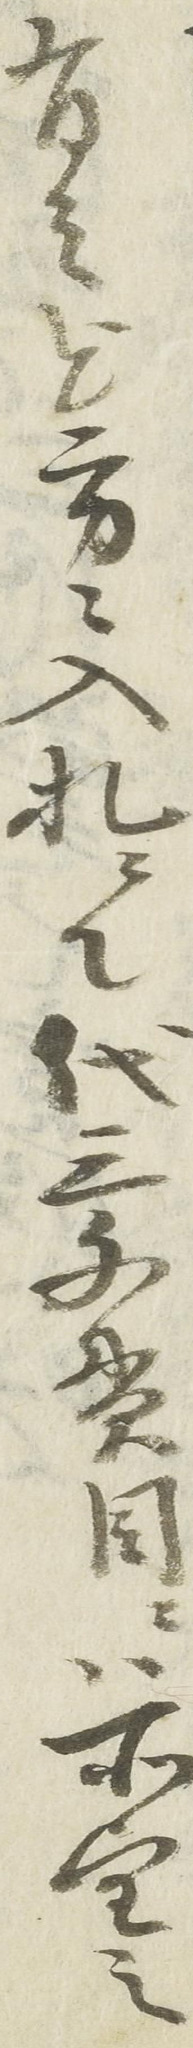有之を方〻入札ニて代三千貫目ニは所望之
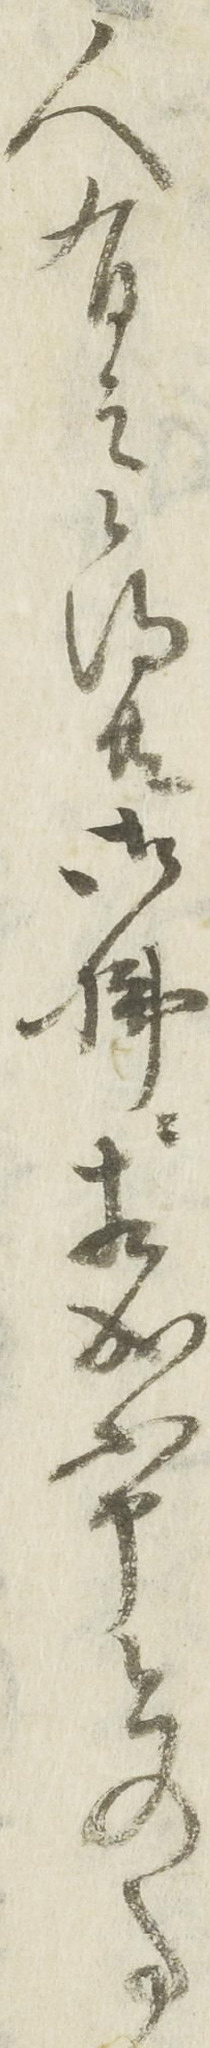人有之候得共御払ニ相成不申との事
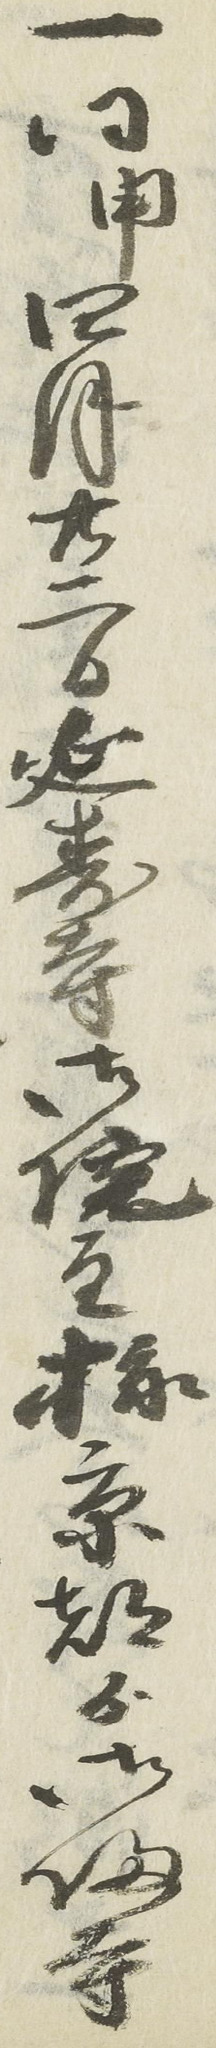一同申四月廿ニ日延寿寺御院主様京都ゟ御帰寺
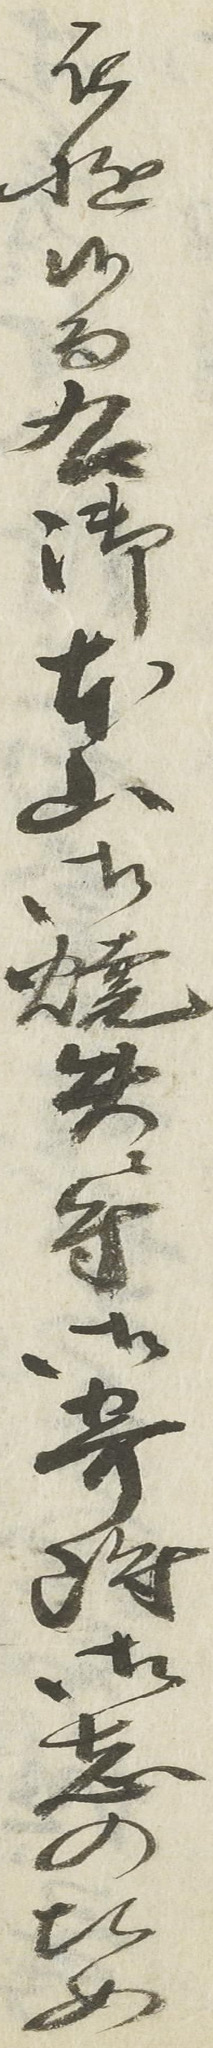被遊候而右御本山御焼失ニ付御寄附御志のため
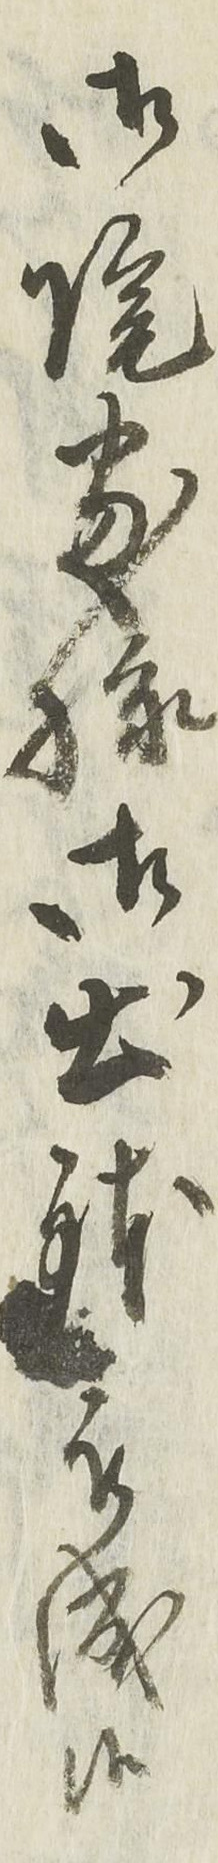御院家様御出体被成候
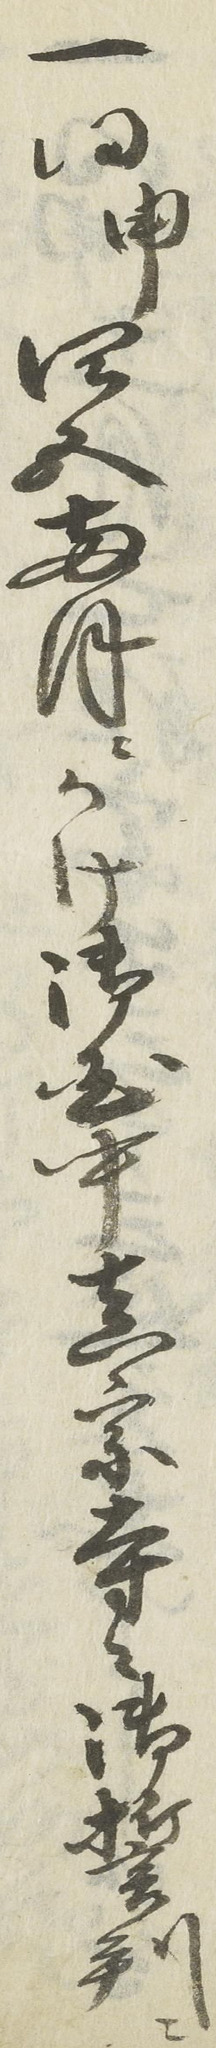一同申四五両月ニかけ御国中真宗寺〻御誓判ニ
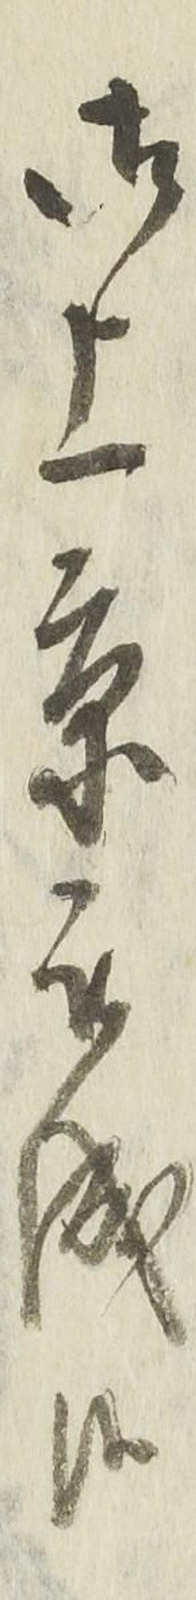御上京被成候
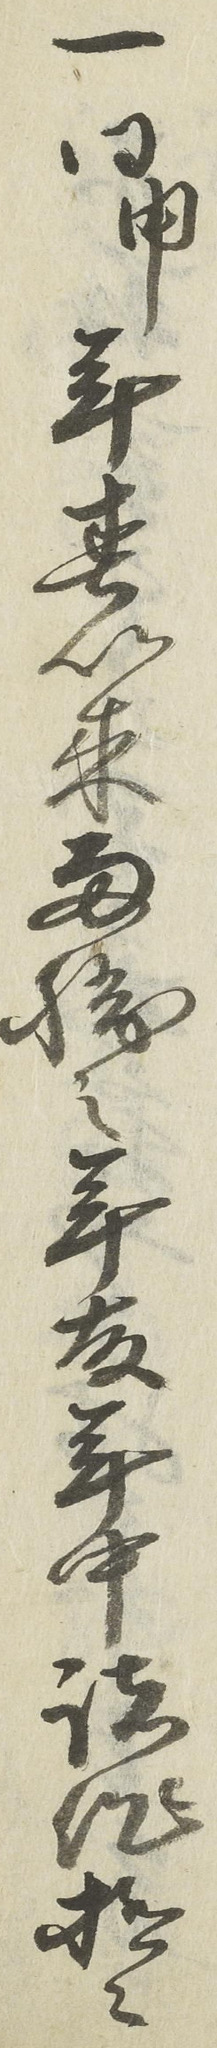一同申年春以来両勝之年故年中諸作極〻

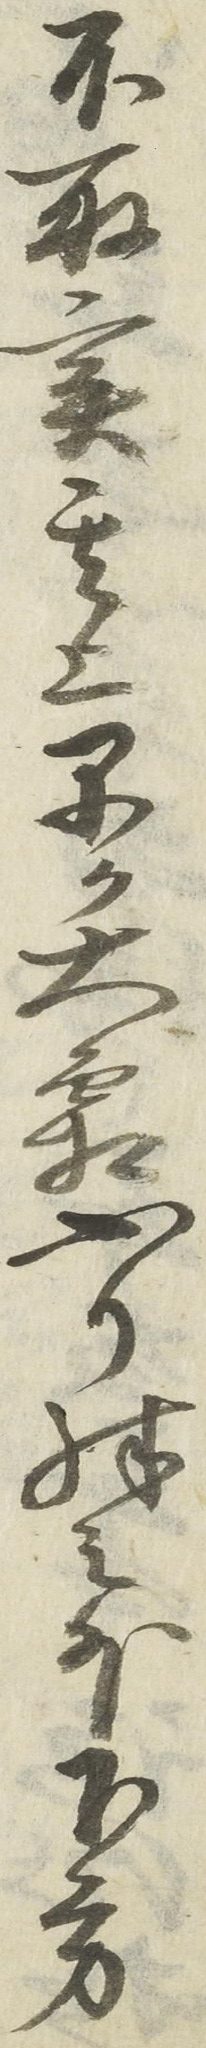不取実其上早ク大霜ふり殊之外下方
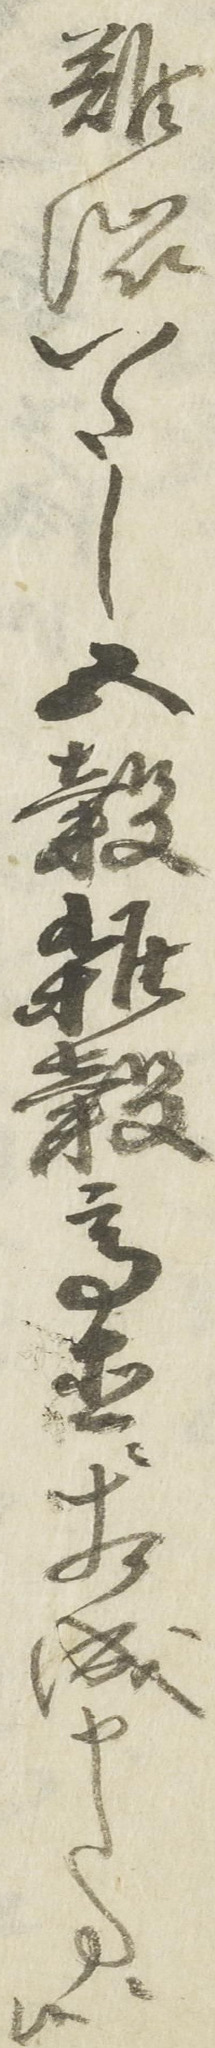難渋いたし五穀雑穀高直ニ相成申事ニ候
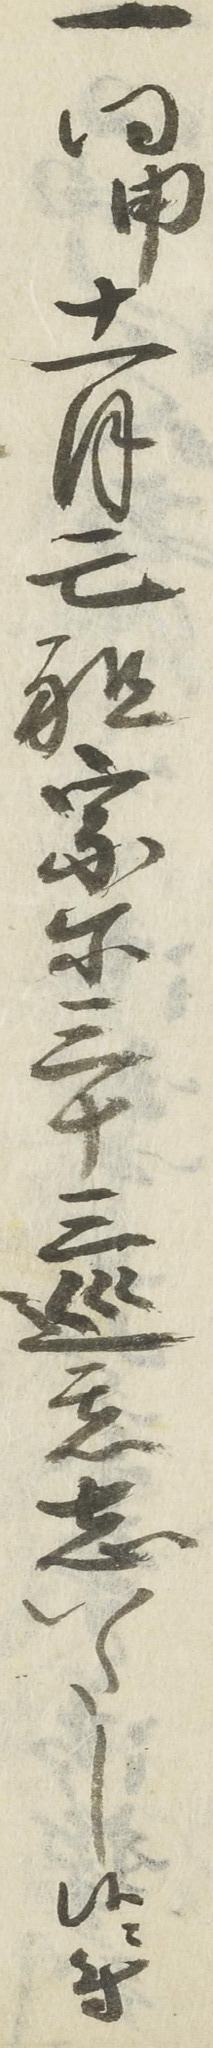一同申十一月亡祖宗尓三十三巡忘志いたし候ニ付
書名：後見笑
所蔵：東京大学地震研究所図書室 Earthquake Research Institute Library, The University of Tokyo, JAPAN
